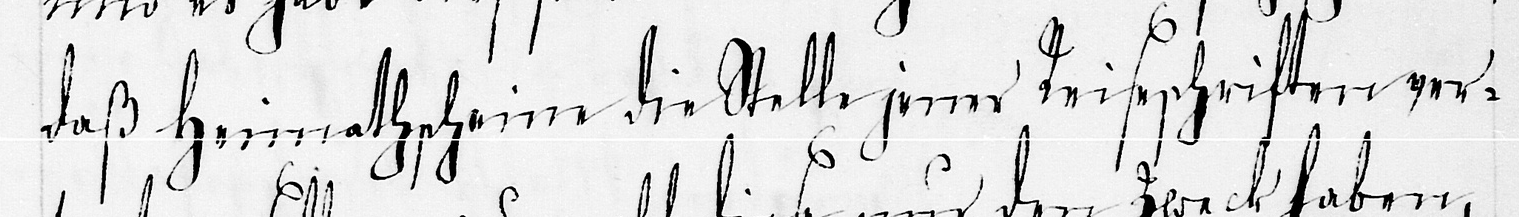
daß Heimathscheine die Stelle jener Reiseschriften ver¬
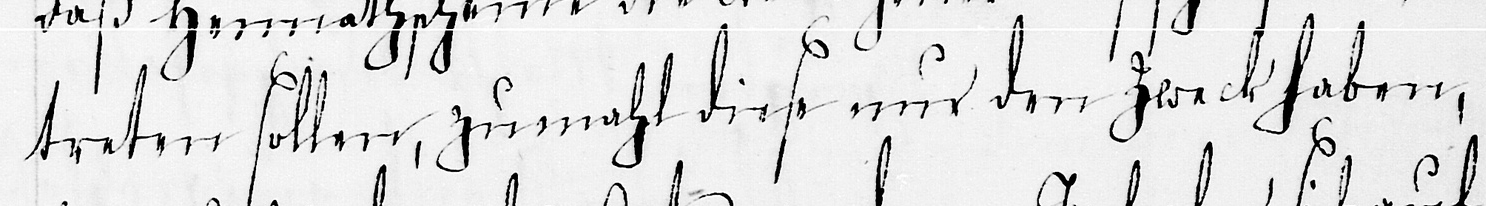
treten sollen, zumahl diese nur den Zweck haben,
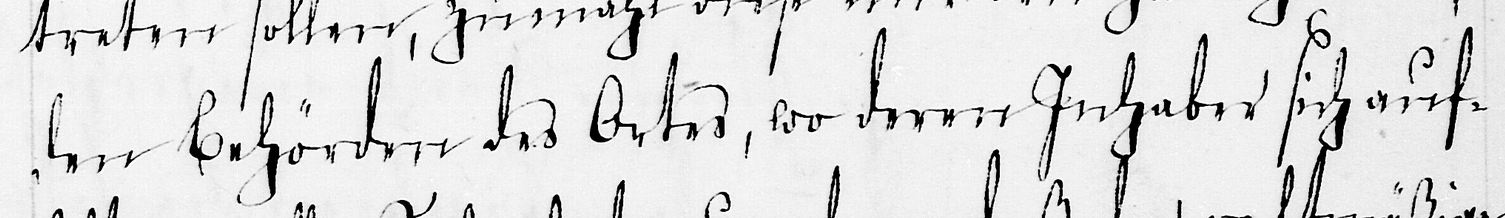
den Behörden des Ortes, wo deren Inhaber sich auf¬
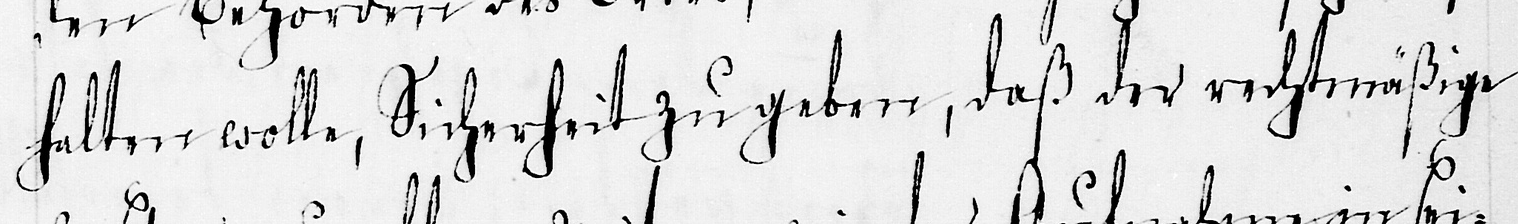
halten wolle, Sicherheit zu geben, daß der rechtmäßige
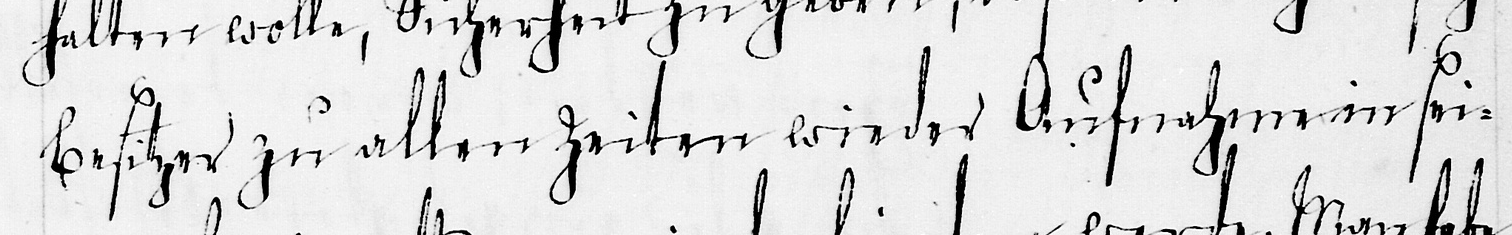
Besitzer zu allen Zeiten wieder Aufnahme in sei¬
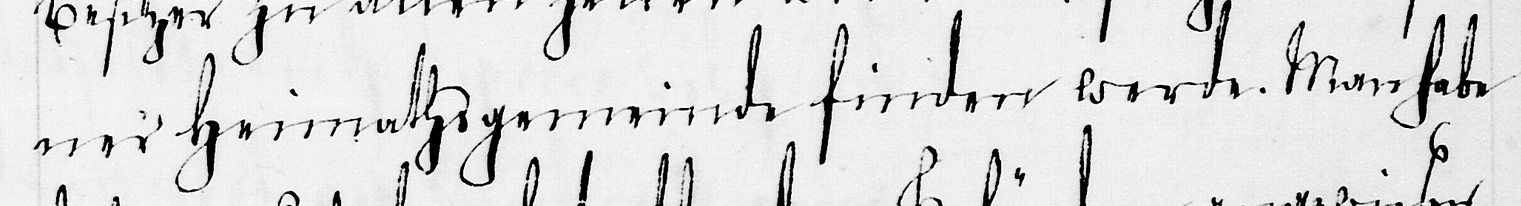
ner Heimathsgemeinde finden werde. Man habe
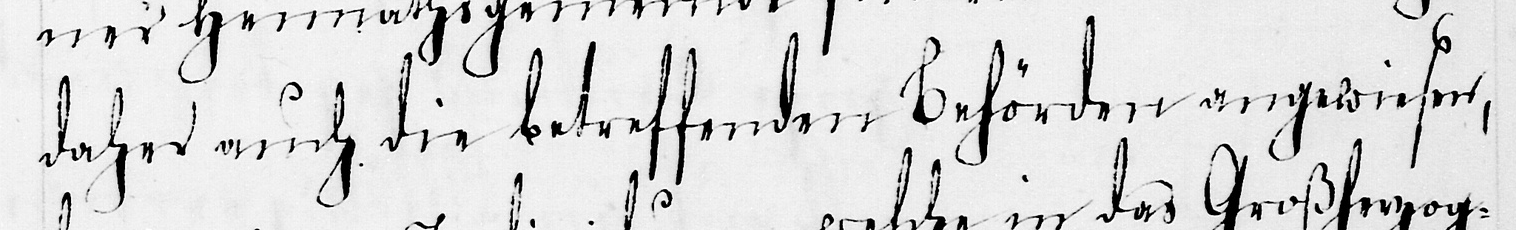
daher auch die betreffenden Behörden angewiesen,
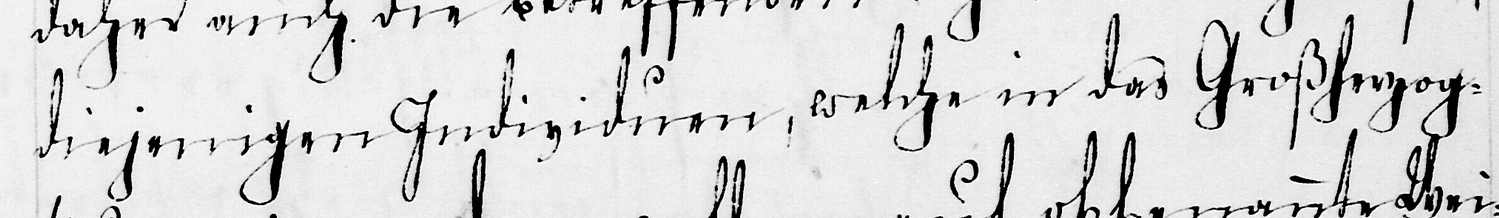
diejenigen Individuen, welche in das Großherzog¬
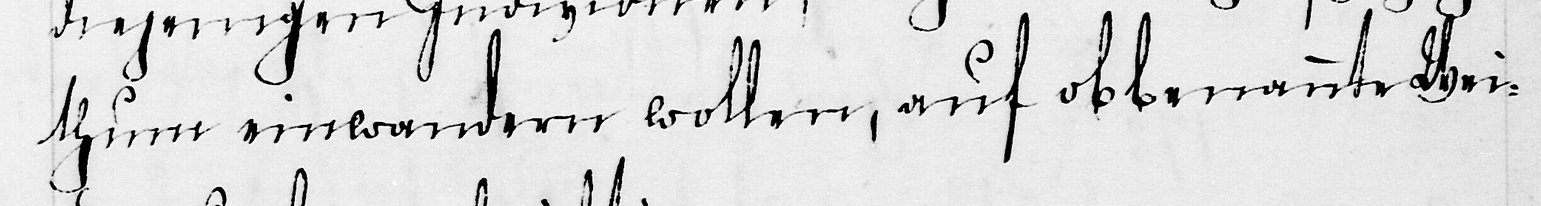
thum einwandern wollen, auf obbenannte Wei¬
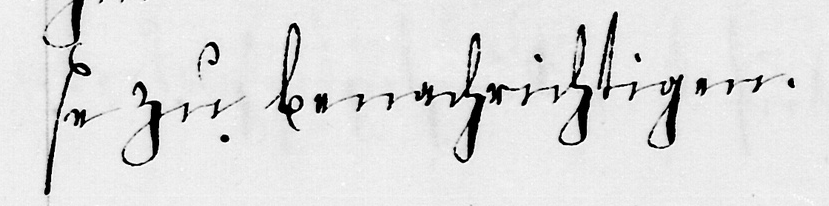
se zu benachrichtigen.
